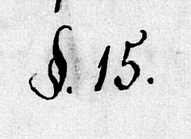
§. 15.
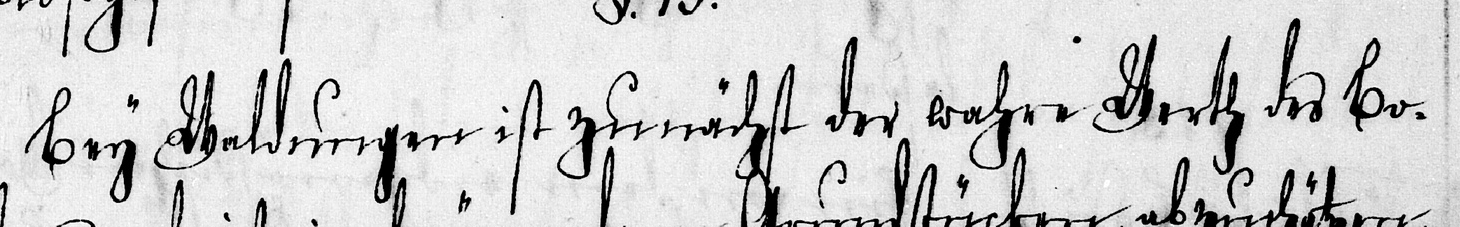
Bey Waldungen ist zunächst der wahre Wert des Bo¬
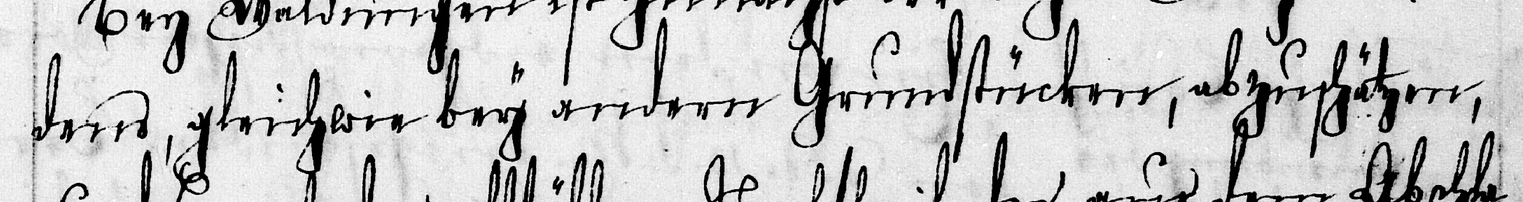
dens, gleichwie bey andern Grundstücken, abzuschätzen,
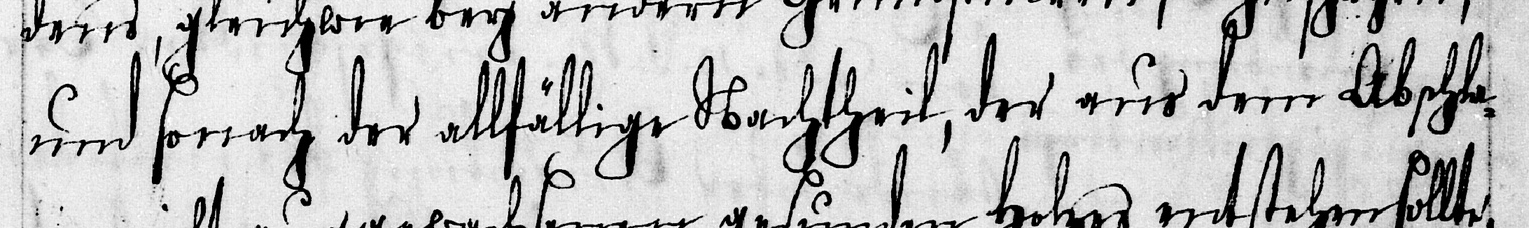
und sonach der allfällige Nachtheil, der aus dem Abschl¬
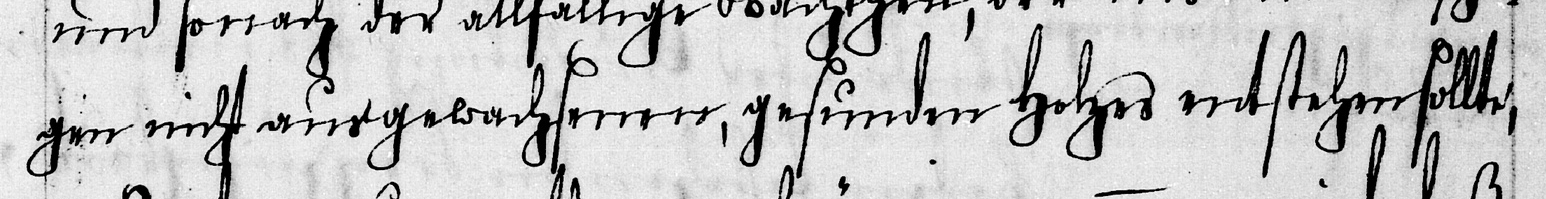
agen nicht ausgewachsenen, gesunden Holzes entstehen sollte,
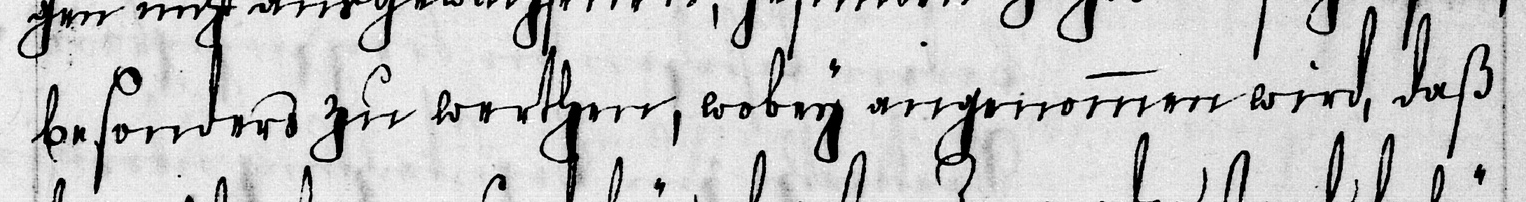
besonders zu werthen, wobey angenommen wird, daß
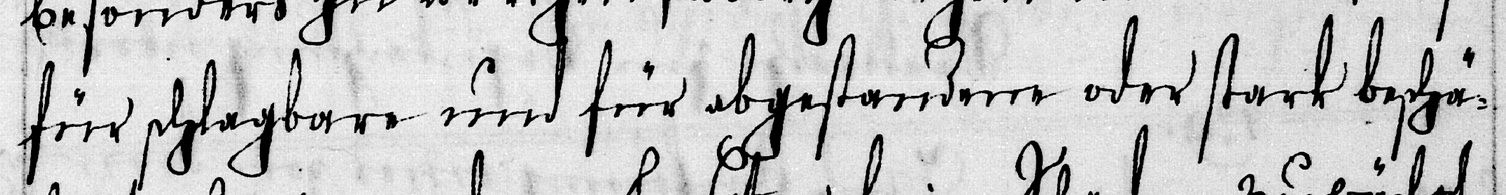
für schlagbare und für abgestandene oder stark beschä¬
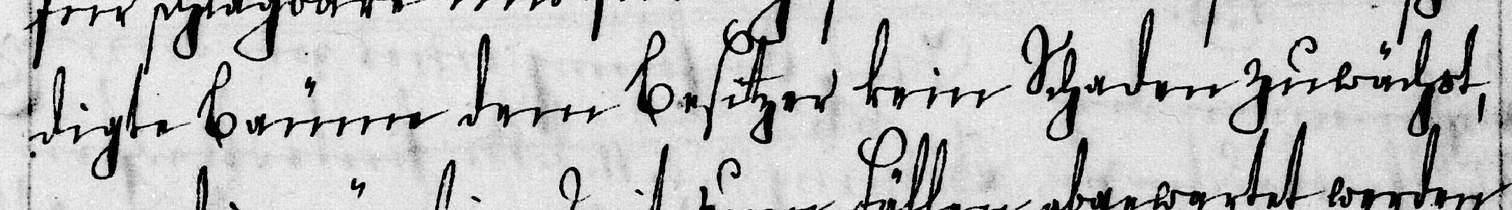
digte Bäume dem Besitzer kein Schaden zuwächst,
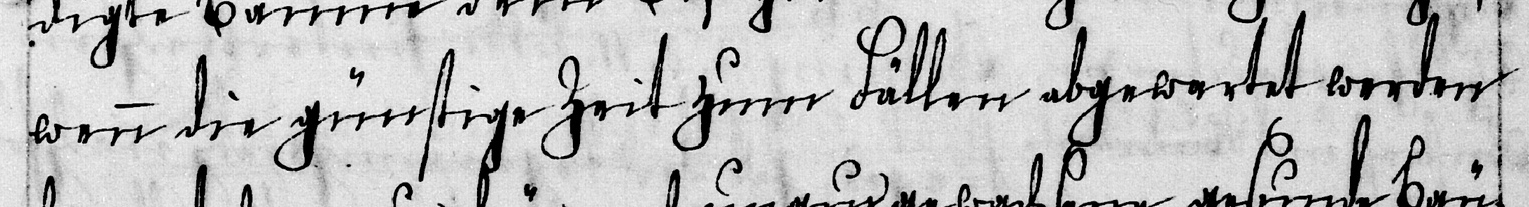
wenn die günstige Zeit zum Fällen abgewartet werden
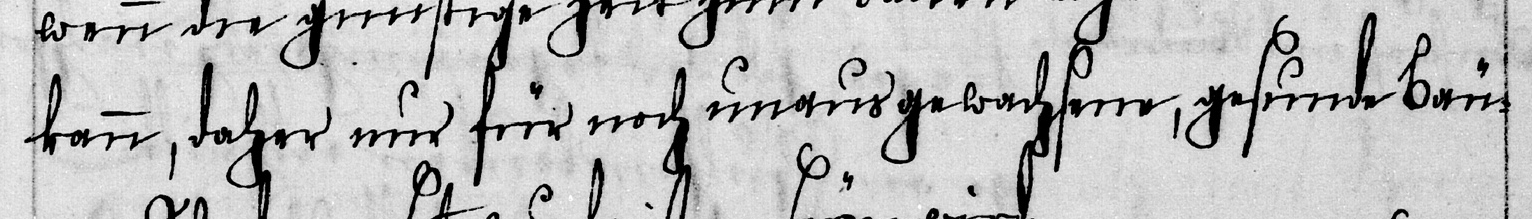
kann, daher nur für noch unausgewachsene, gesunde Bäu¬
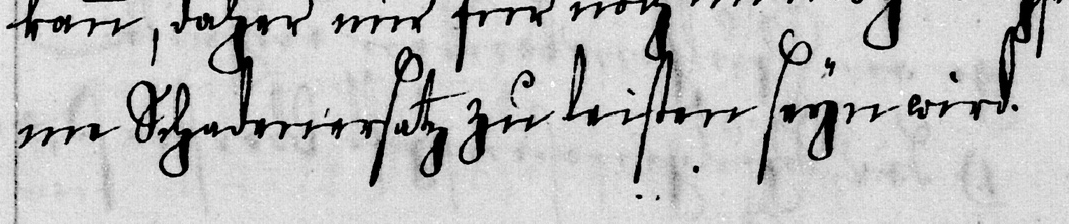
me Schadenersatz zu leisten seyn wird.
